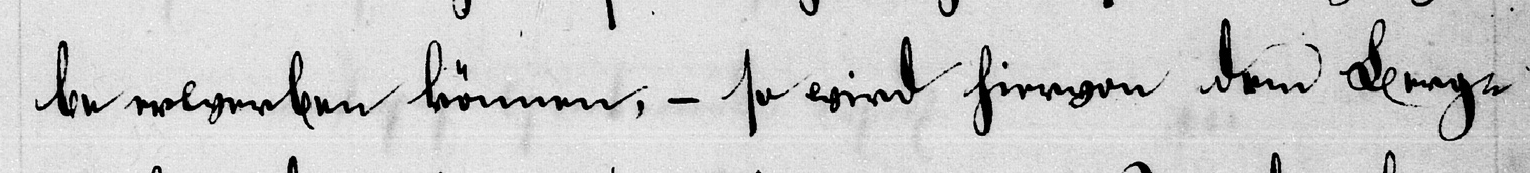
be erwerben können, – so wird hiervon dem Berg¬
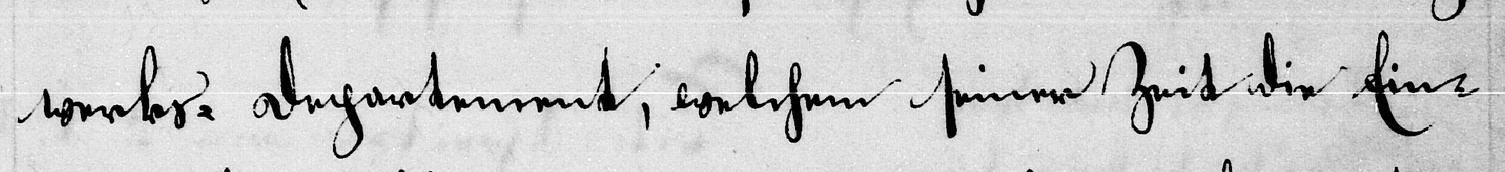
werks-Departement, welchem seiner Zeit die Ein¬
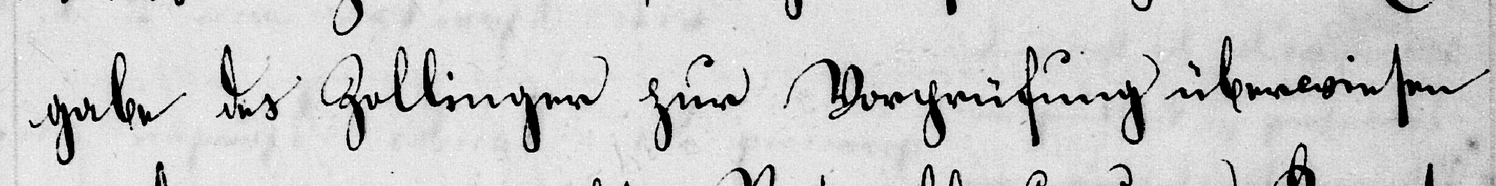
gabe des Zollinger zur Vorprüfung überwiesen
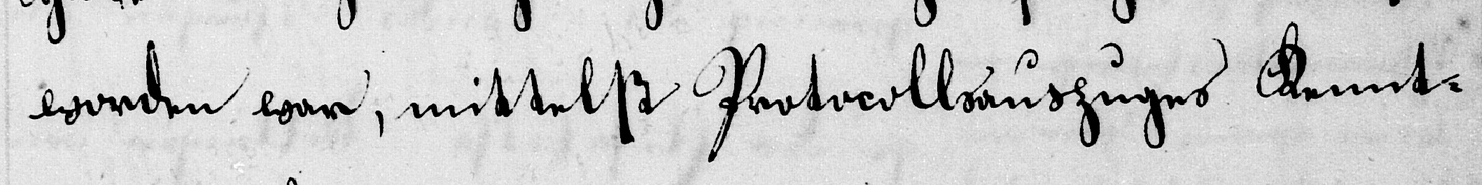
worden war, mittelst Protocollsauszuges Kennt¬
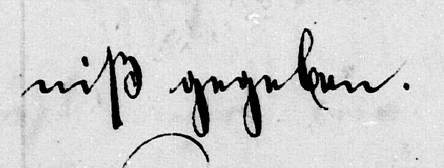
niß gegeben.
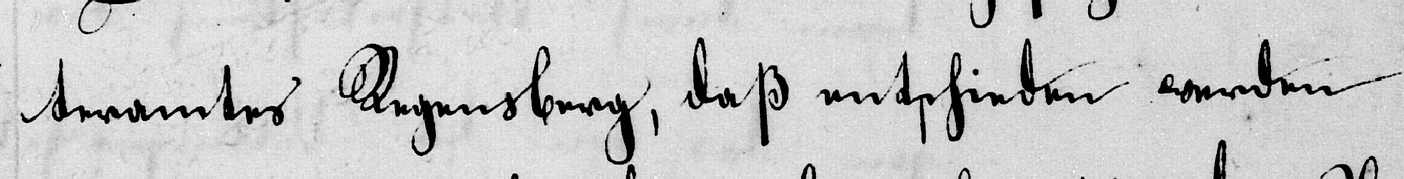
teramtes Regensberg, daß entschieden werden
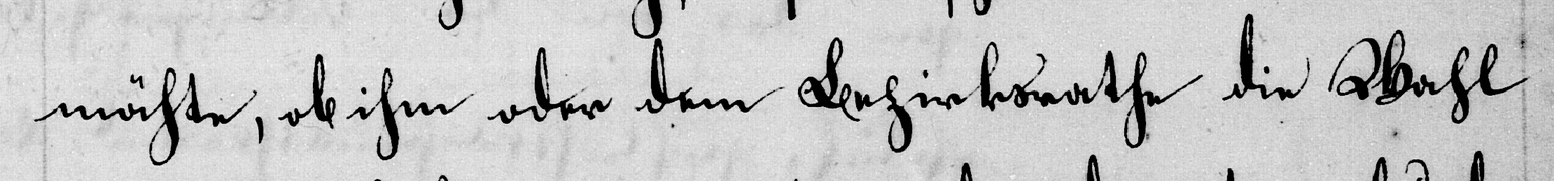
möchte, ob ihm oder dem Bezirksrathe die Wahl
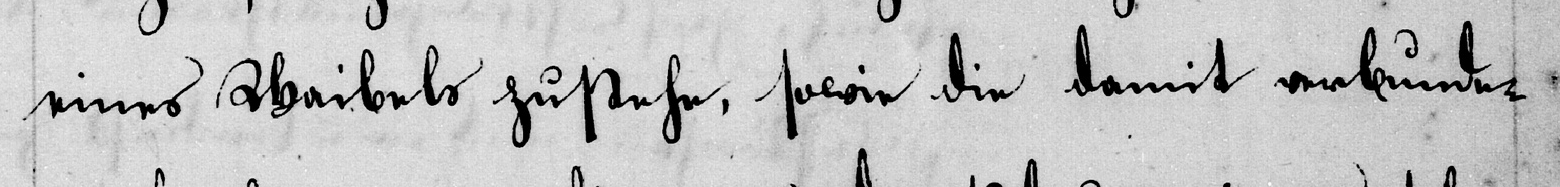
eines Waibels zustehe, sowie die damit verbunde¬
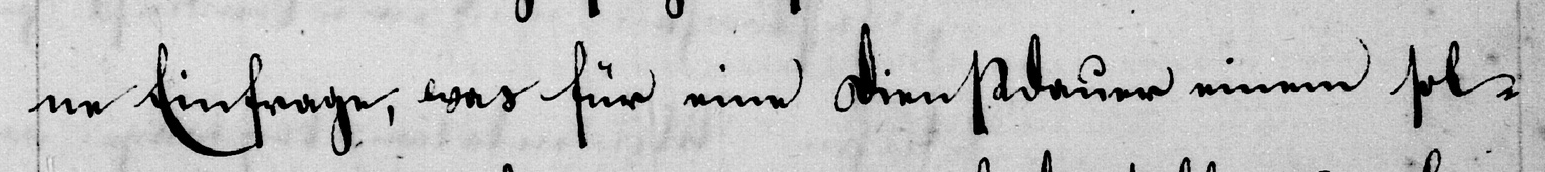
ne Einfrage, was für eine Dienstdauer einem sol¬
